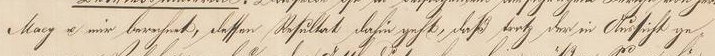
Maey & mir berechnet, dessen Resultat dahin geht, daß trotz der in Aussicht ge-
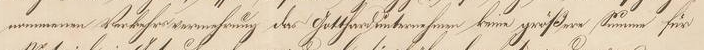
nommenen Verkehrsvermehrung das Gotthardunternehmen keine größere Summe für
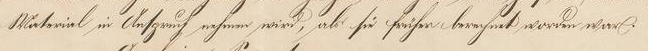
Material in Anspruch nehmen wird, als sie früher berechnet worden war.
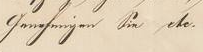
Genehmigen Sie etc.
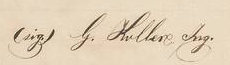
(sig.) G. Koller Ing.
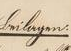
Gotthardnetz.
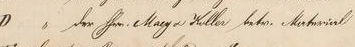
D. " der HHerrn. Maey & Koller betr. Material
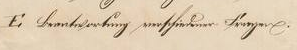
E. Beantwortung verschiedener Fragen.
